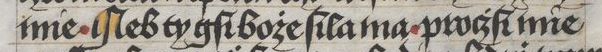mie.Neb ty gſi boże ſila ma.procżſi mie
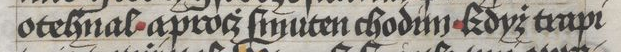otehnal.aprocż ſmuten chodím.když trapí
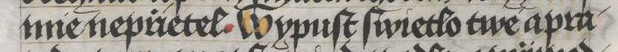mie nepṙíetel.Wypuſt ſwietlo twé a pra¬
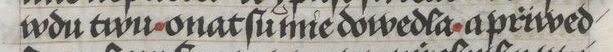wdu twu.onat ſu mie dowedla.a pṙiwed¬
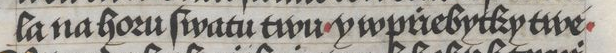la na horu ſwatu twu.y wpṙiebytky twé.
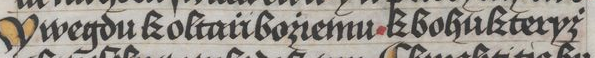Vwegdu k oltaṙi božiemu.k bohu kteryż
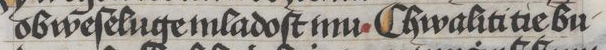obweſeluge mladoſt mu.Chwaliti tie bu¬
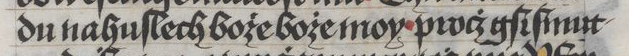du nahuſlech boże boże moy.procż gſi ſmut¬
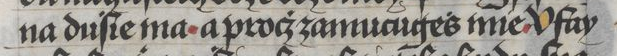na duẛie ma.a procż zamucugeṡ mie.Vſay¬
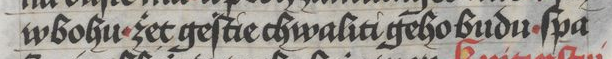w bohu.žet geẛtie chwaliti geho budu.ſpa
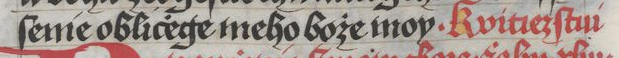ſeníe obliċege meho boże moy.Kvitiezſtuí
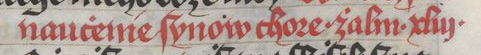nauċeníe ſynow choee.žalm.xliij.
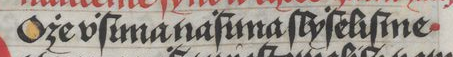Ože vẛima naẛima ſlyẛeliſme.
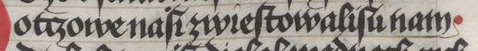otczowe naẛi zwieſtowaliſu nam.
